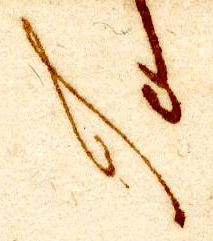To
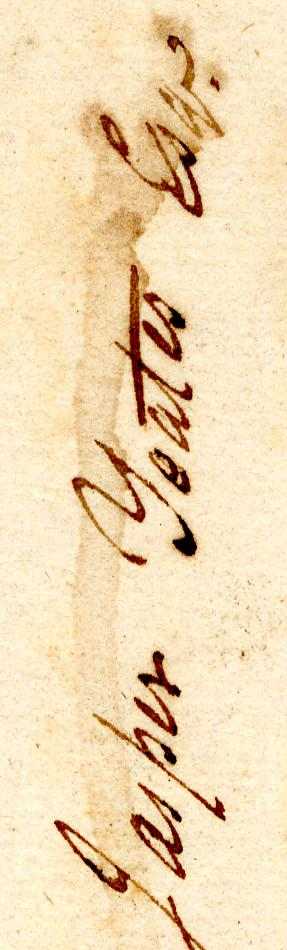Jasper Yeates Esq^r.
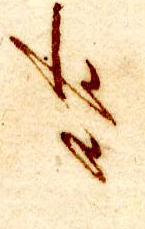at
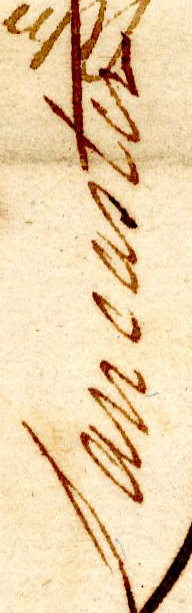Lancaster
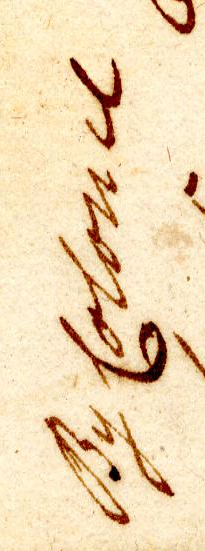By Colonel
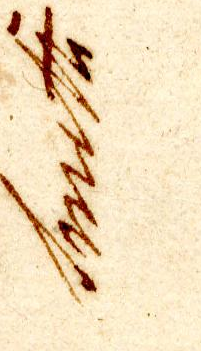Smith
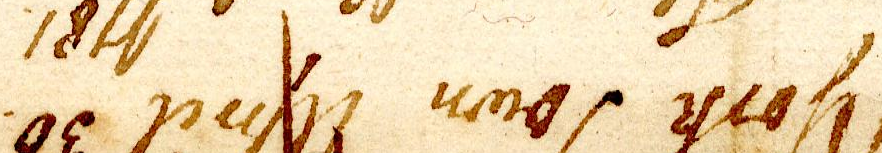York Town April 30
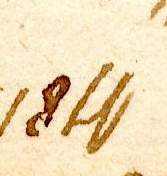1781
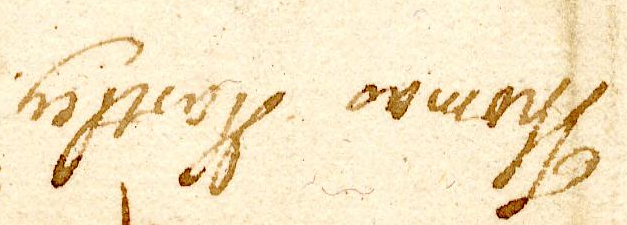Thomas Hartley
